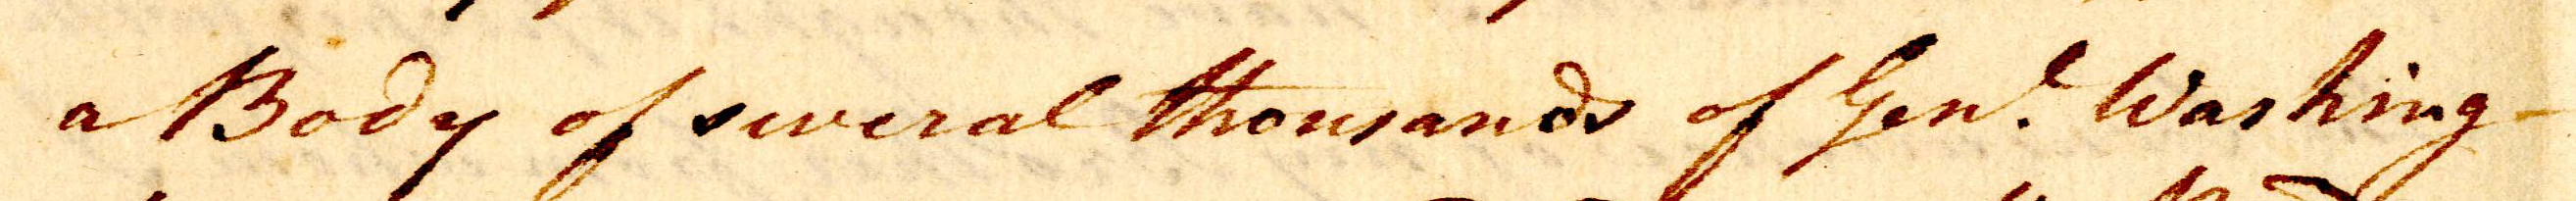a Body of several thousands of Gen^l. Washing-
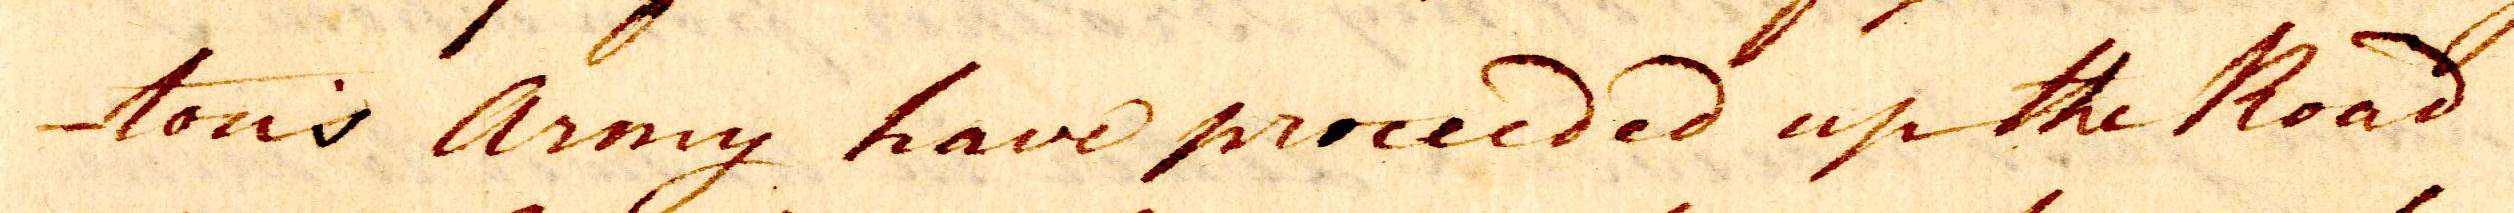-ton's Army have proceeded up the Road
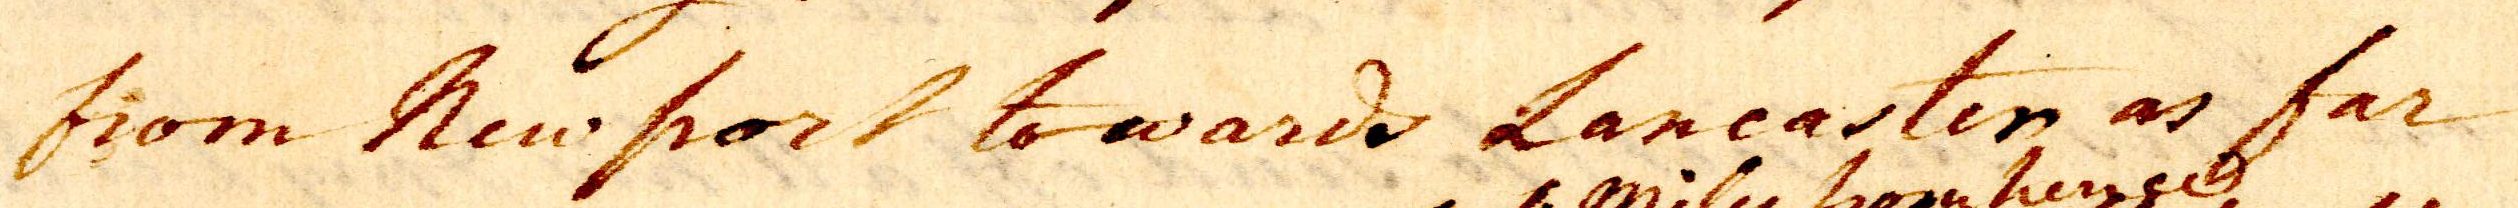from Newport towards Lancaster as far
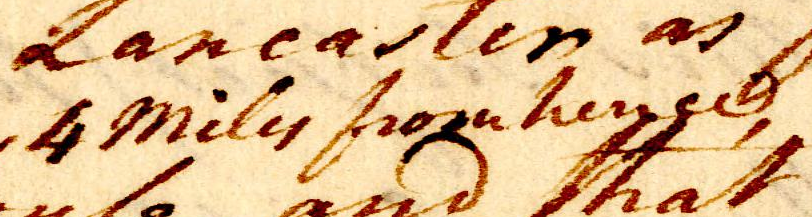4 miles from hence
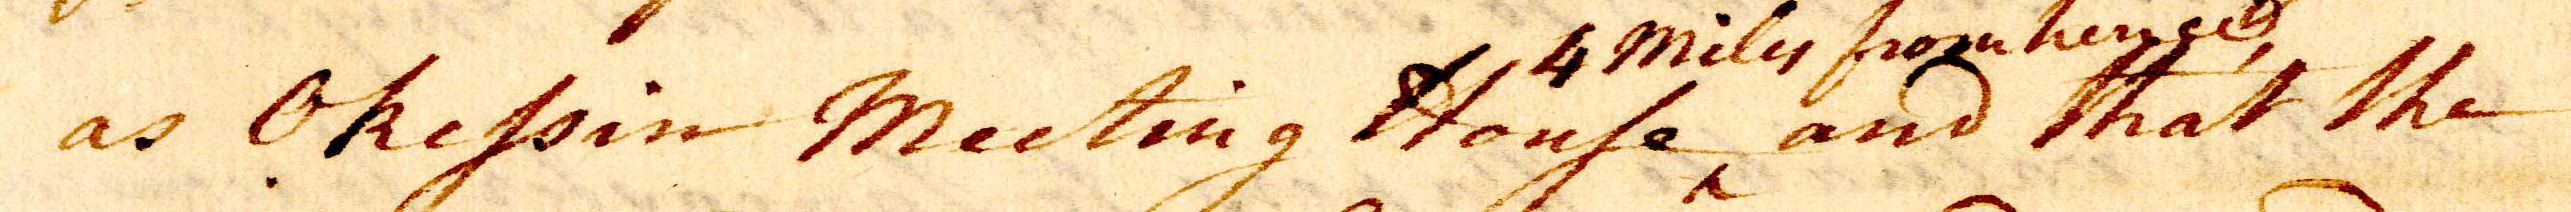as Okessin Meeting House ^ and that the
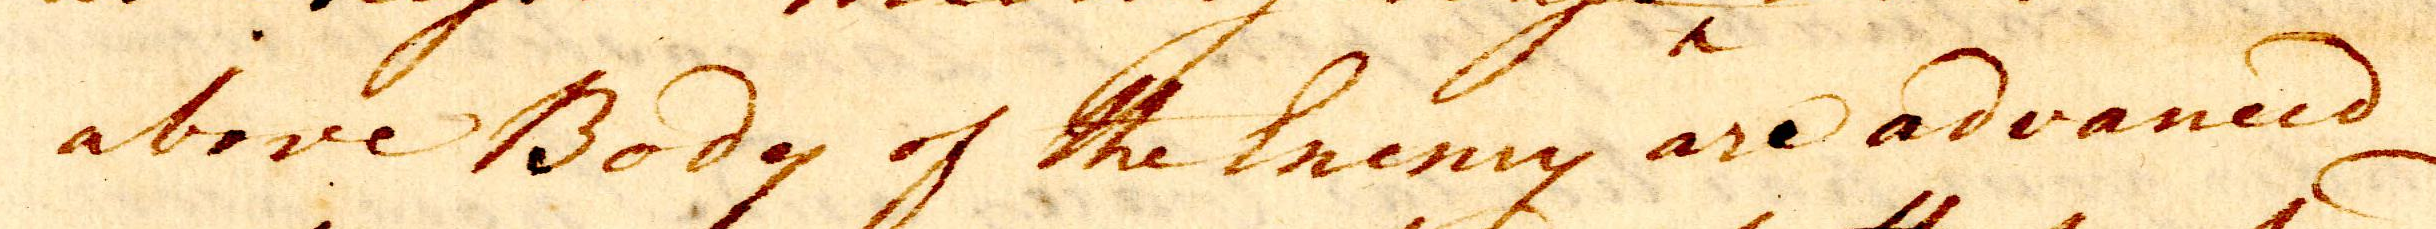above Body of the Enemy are advanced
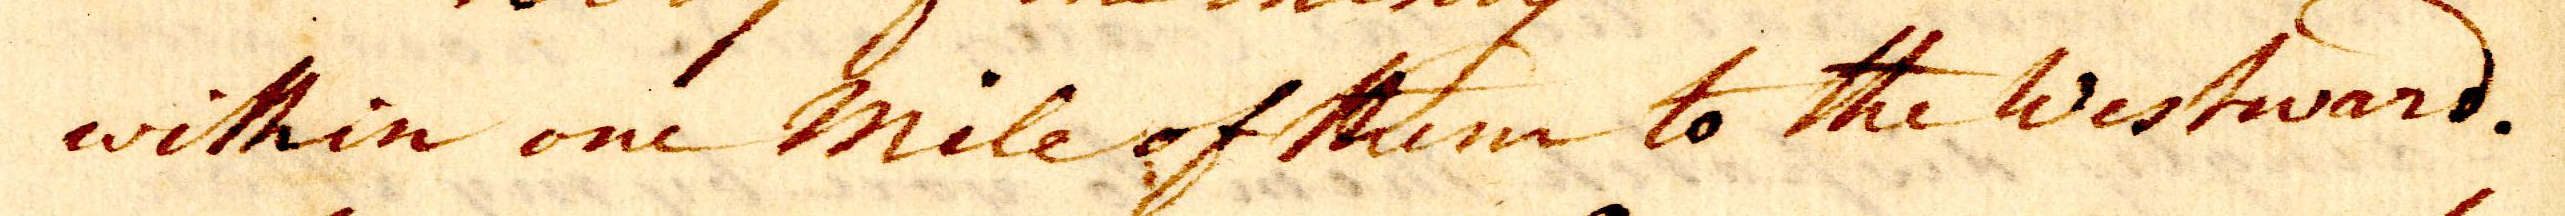within one Mile of them to the Westward.
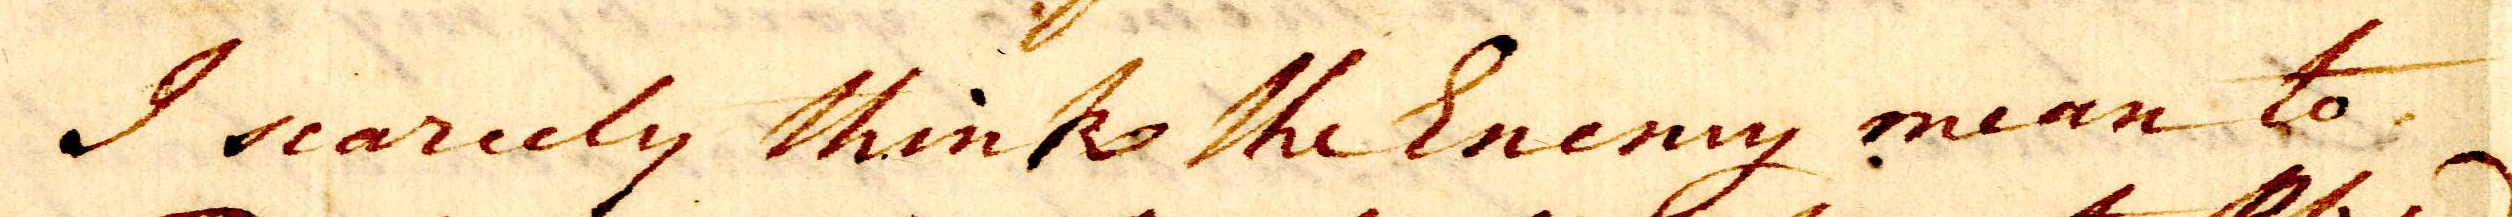I scarcely think the Enemy mean to
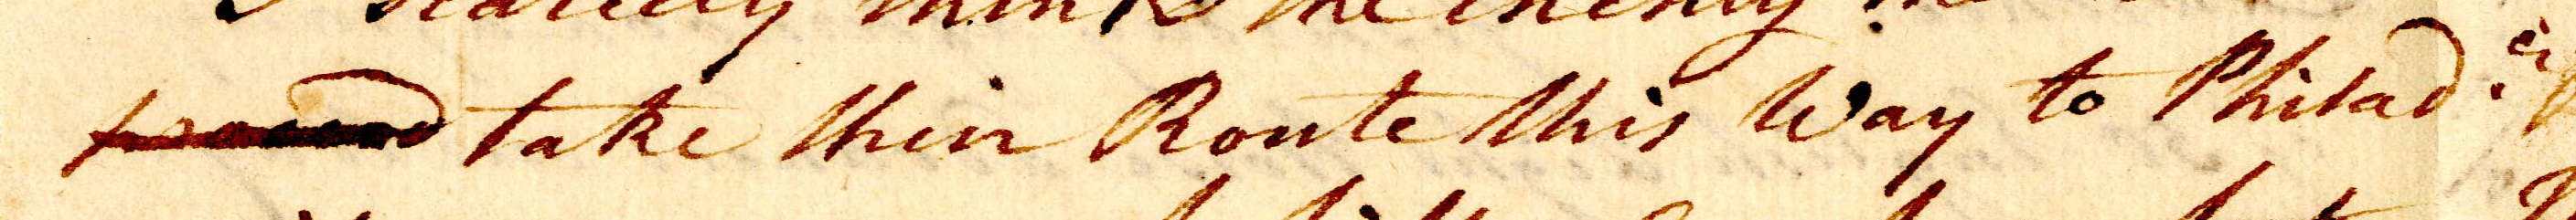[______] take their Route this way to Philad^a.
